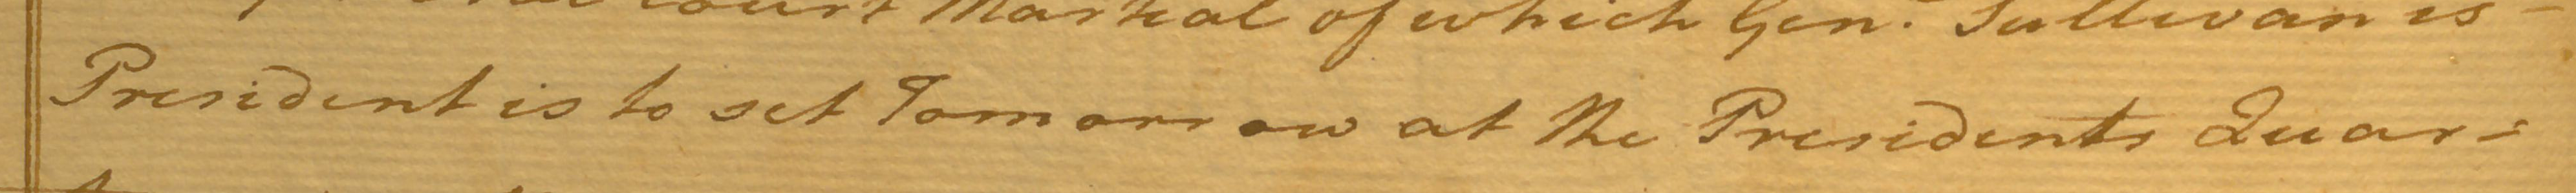President is to set Tomorrow at the Presidents Quar-
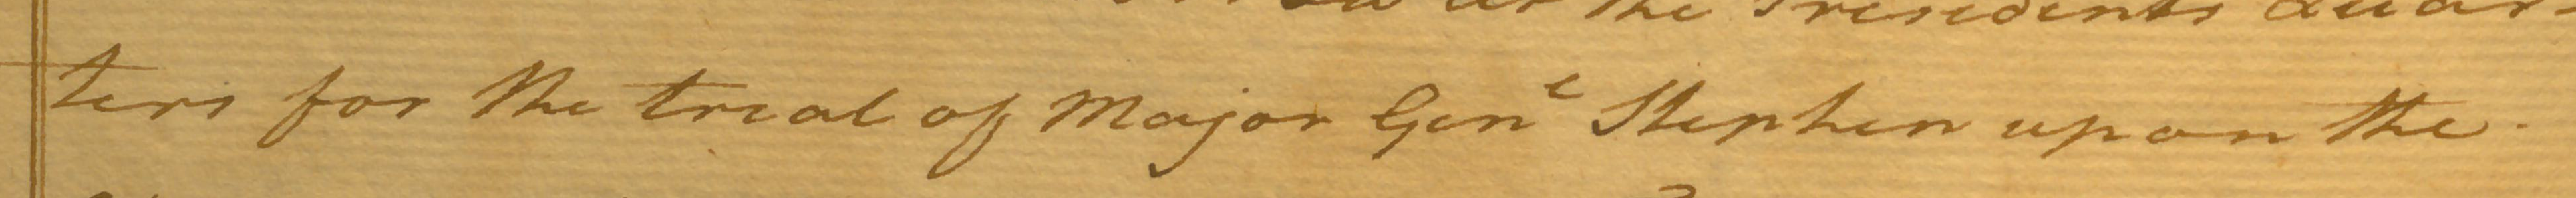ters for the trial of Major Gen^l Stephens upon the
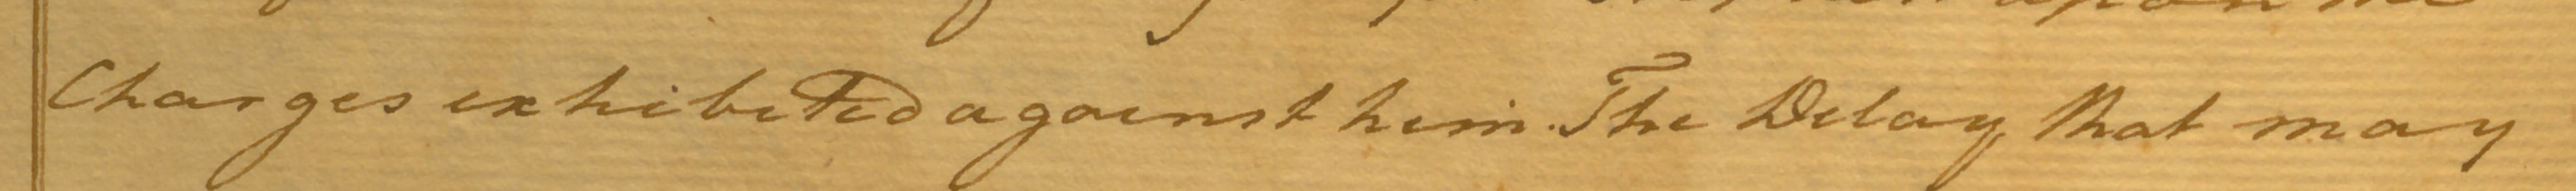charges exhibited against him. The Delay that may
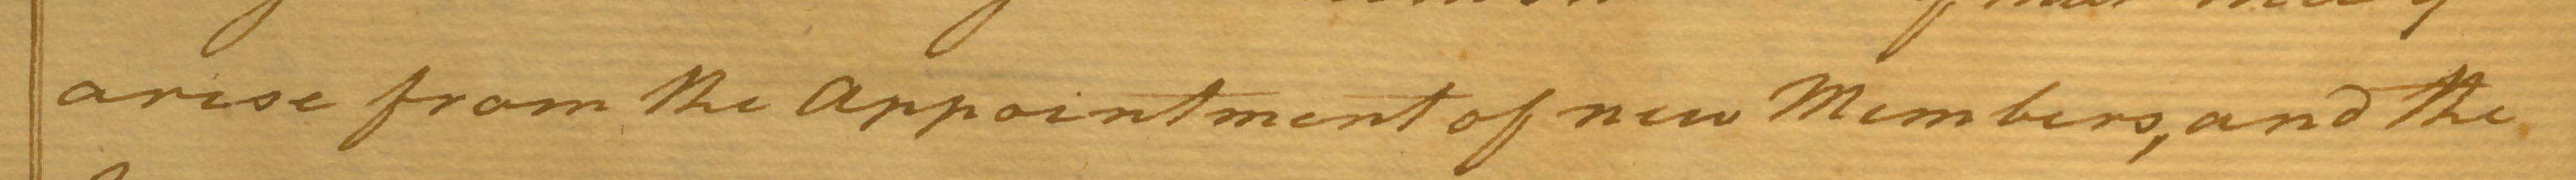arise from the appointment of new Members, and the
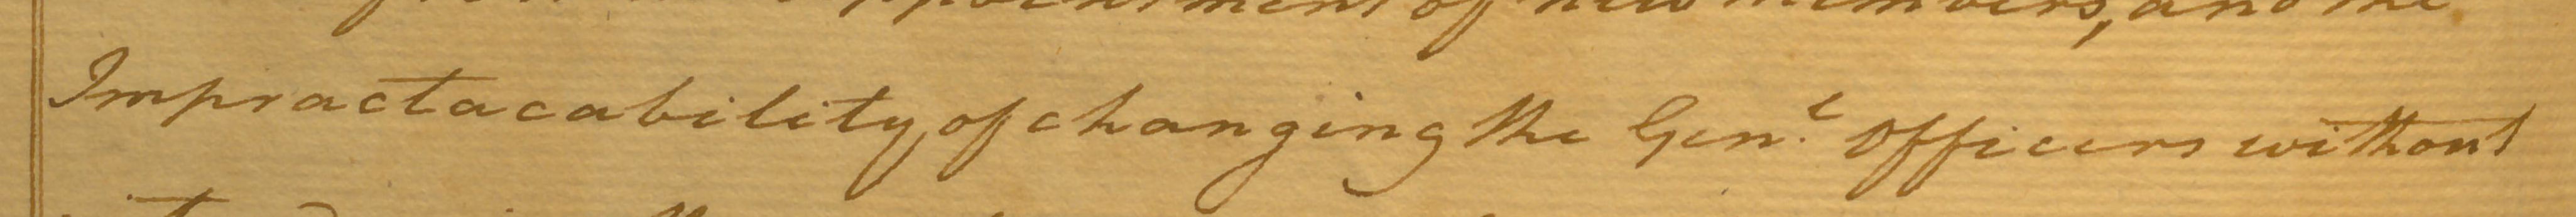Impractacability of changing the Gen^l. officers without
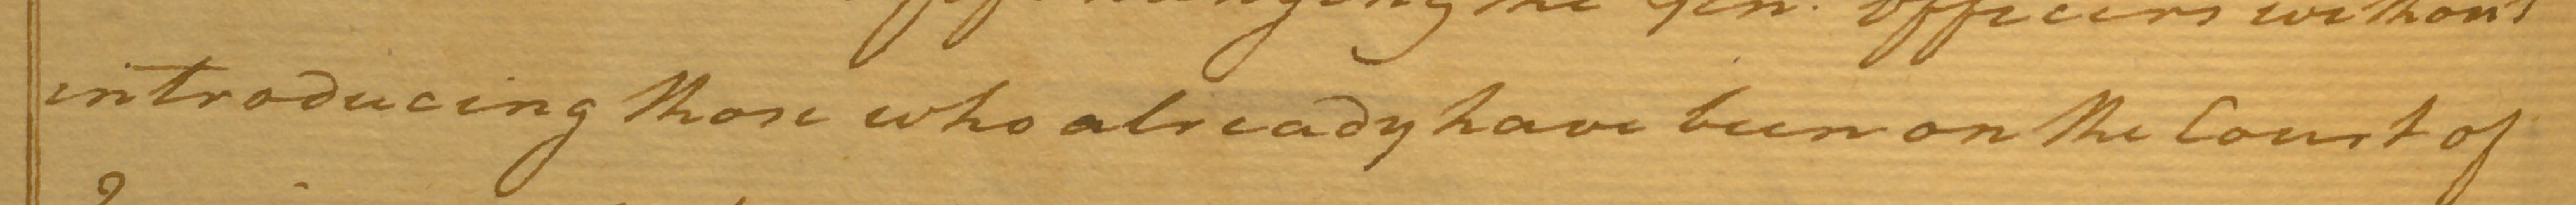introducing those who already have been on the Court of
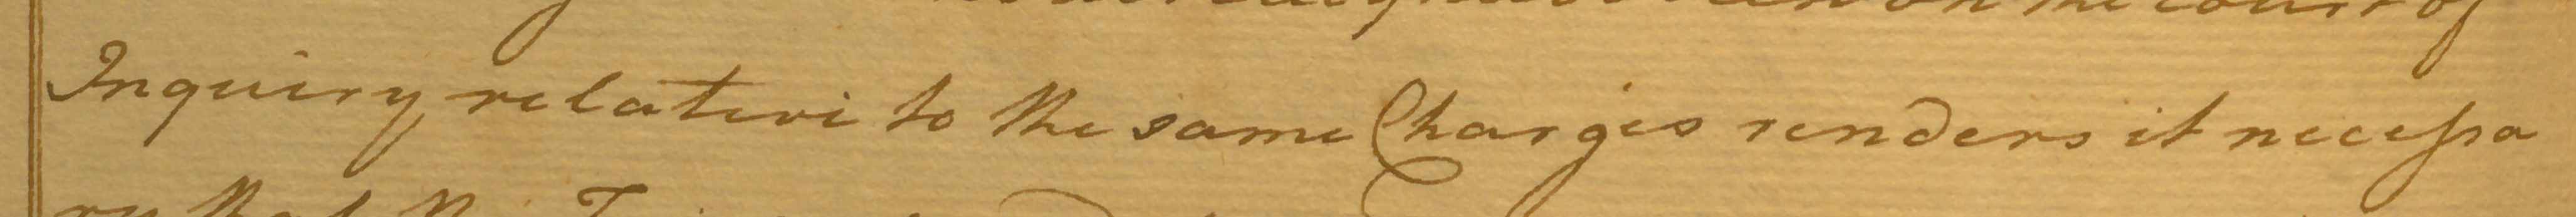Inquiry relative to the same Charges renders it necessa
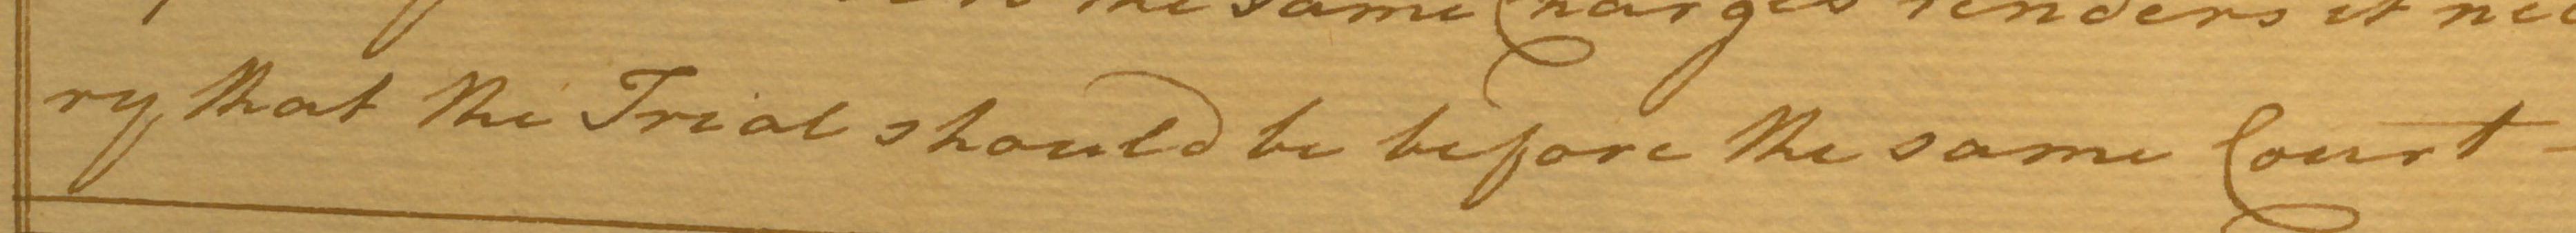ry that the Trial should be before the same Court
